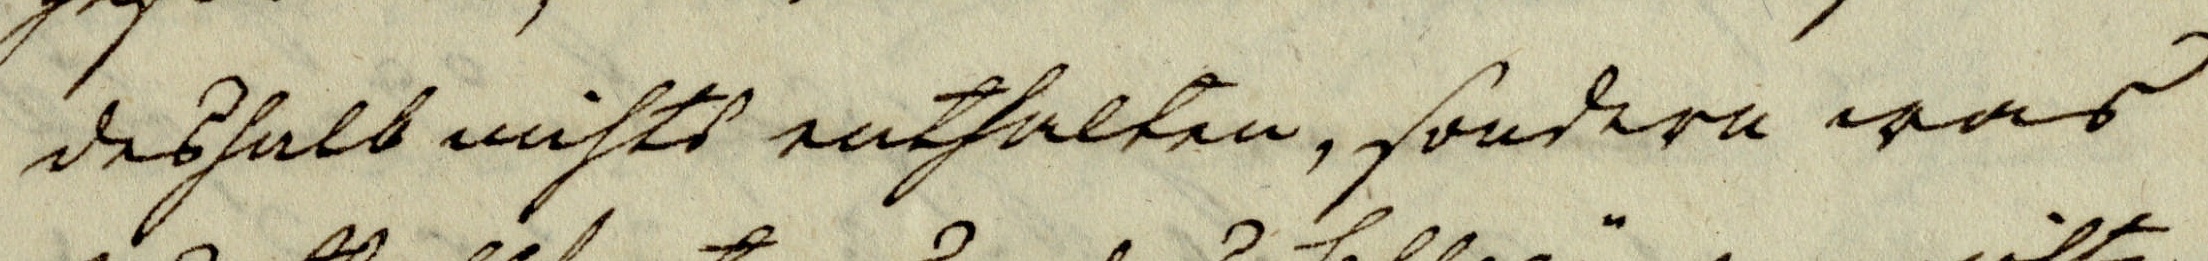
deshalb nichts enthalten, sondern was
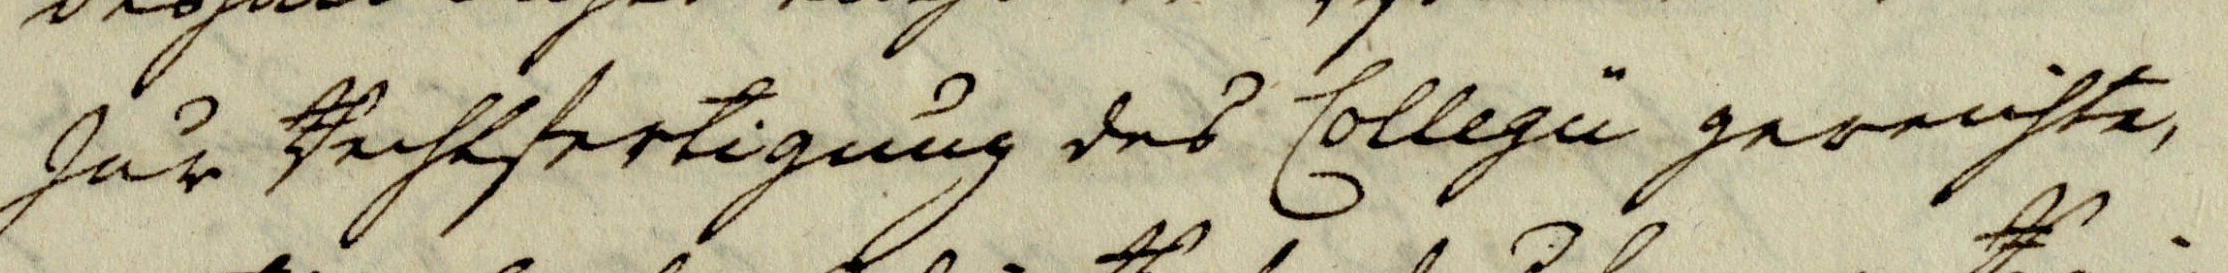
zur Rechtfertigung des Collegii gereichte,
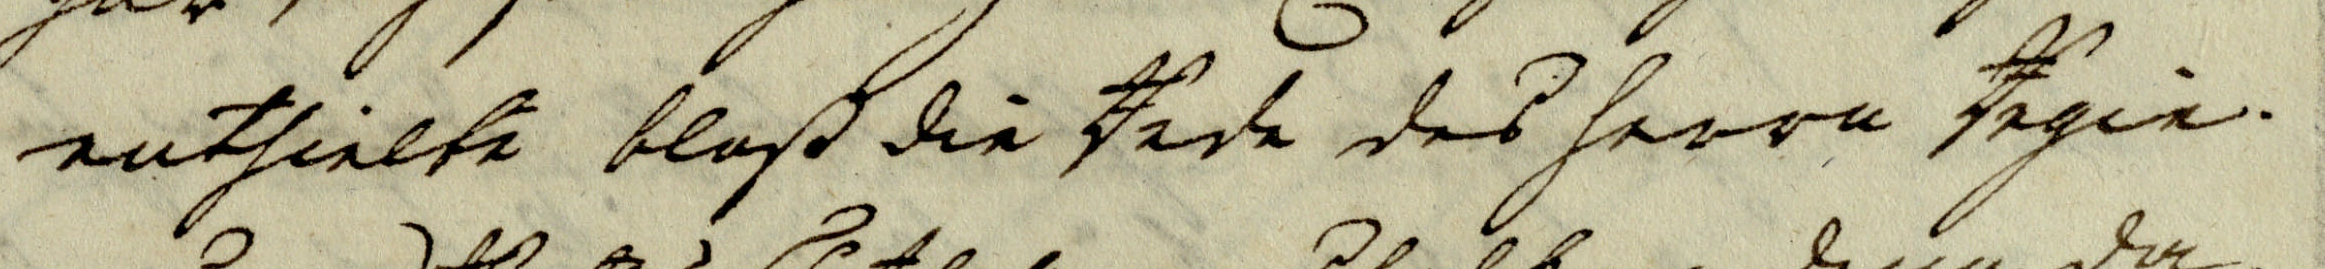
enthielte bloß die Rede des Herrn Regie¬
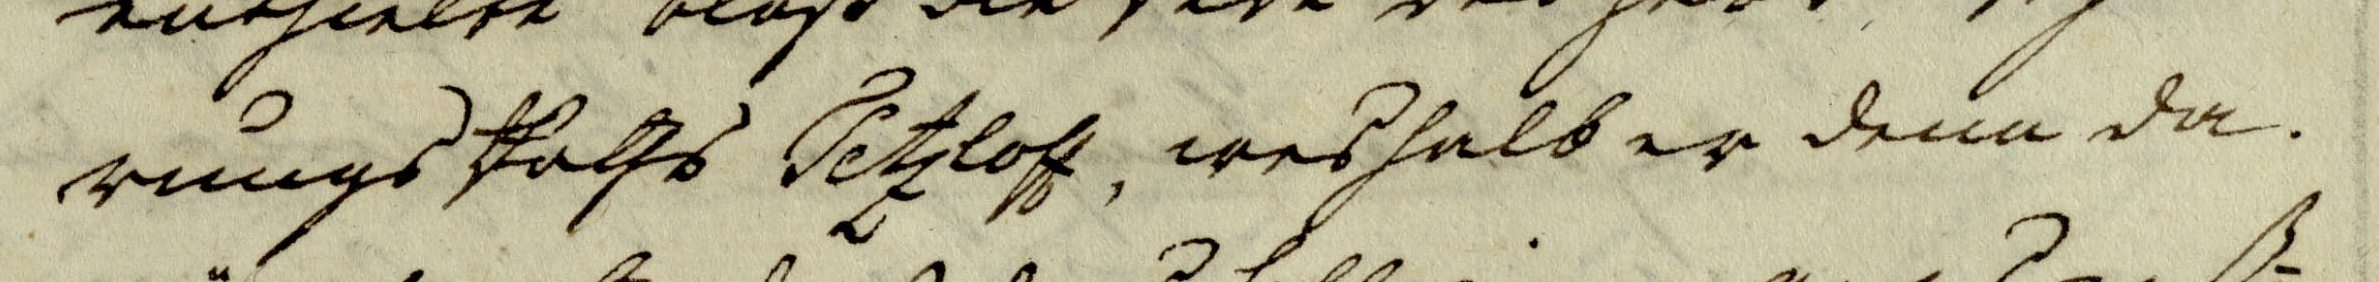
rungs Raths Tetzloff, weshalb er denn da¬
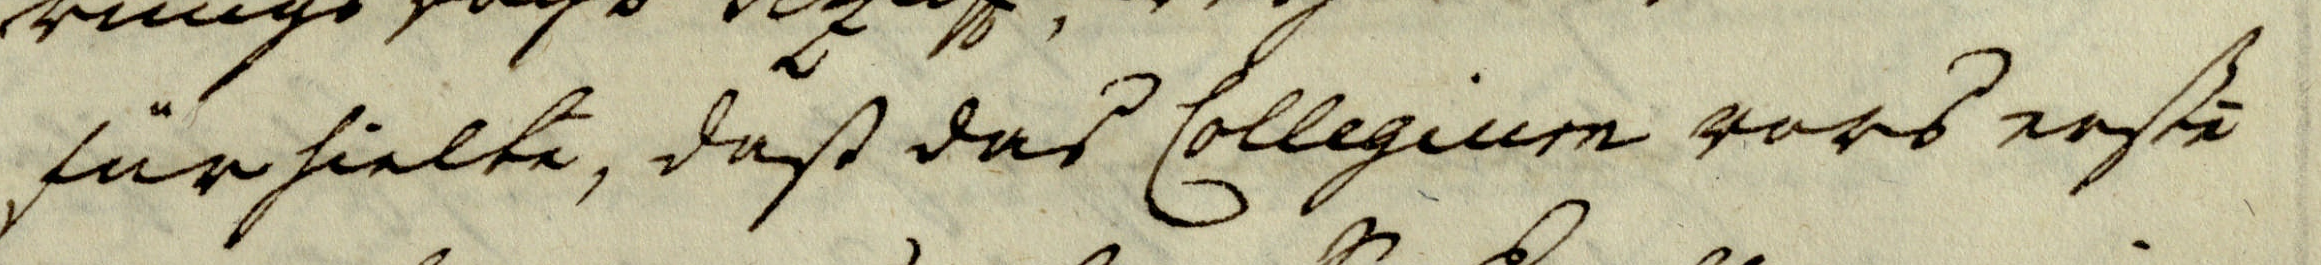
für hielte, daß das Collegium vors erste
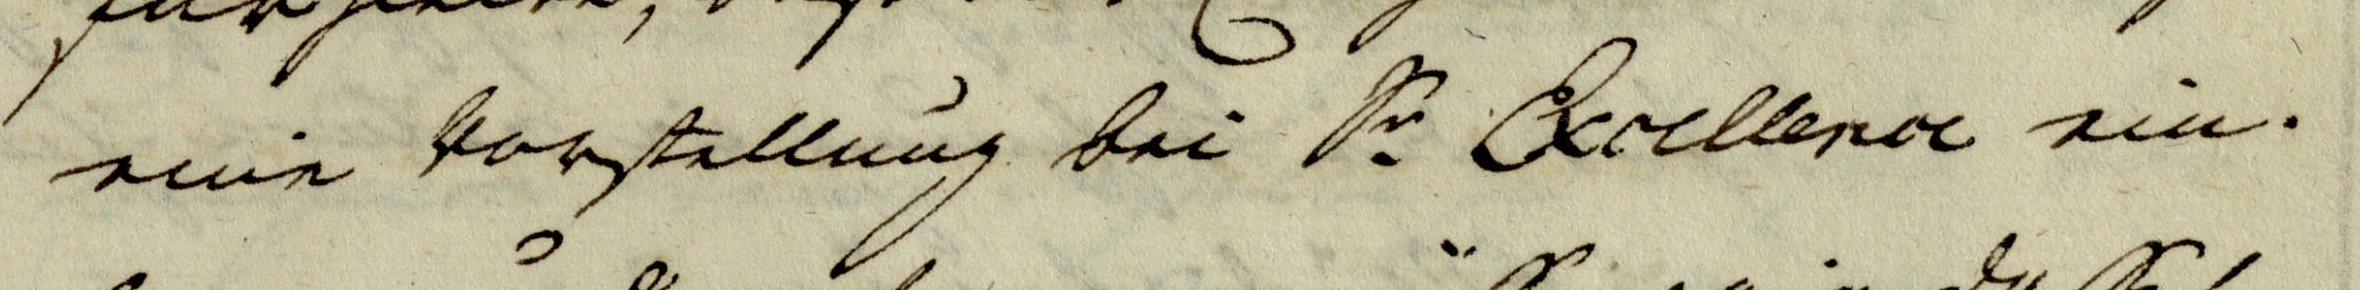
eine Vorstellung bei Sr Excellence ein¬
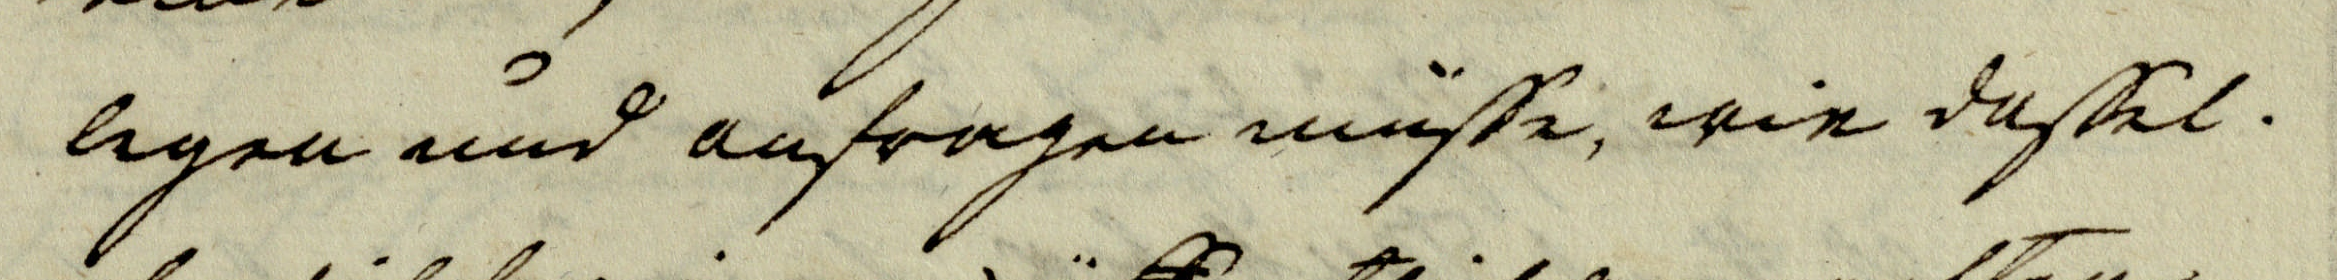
legen und anfragen müsse, wie dassel¬
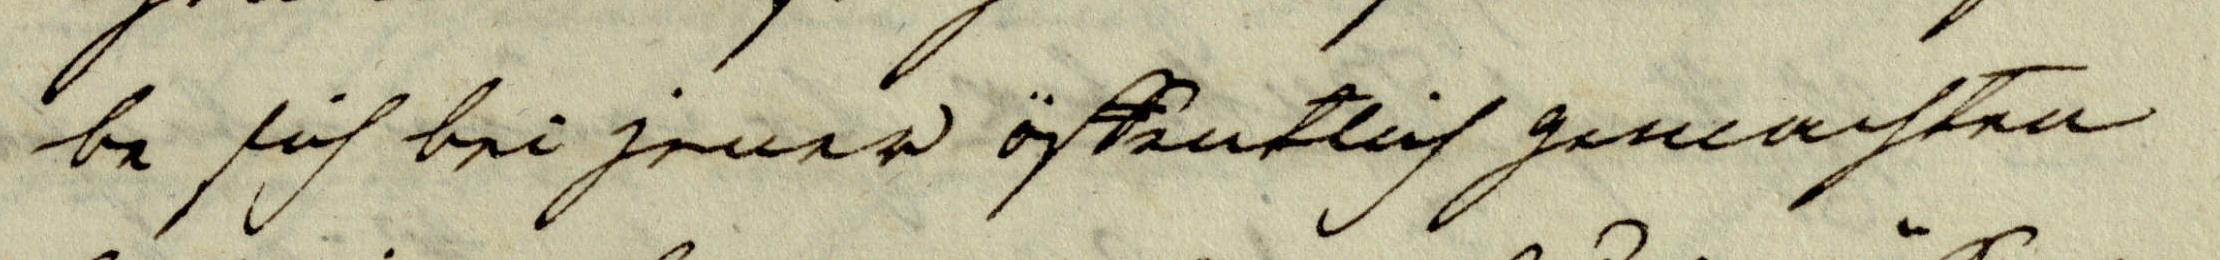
be sich bei jener öffentlich gemachten
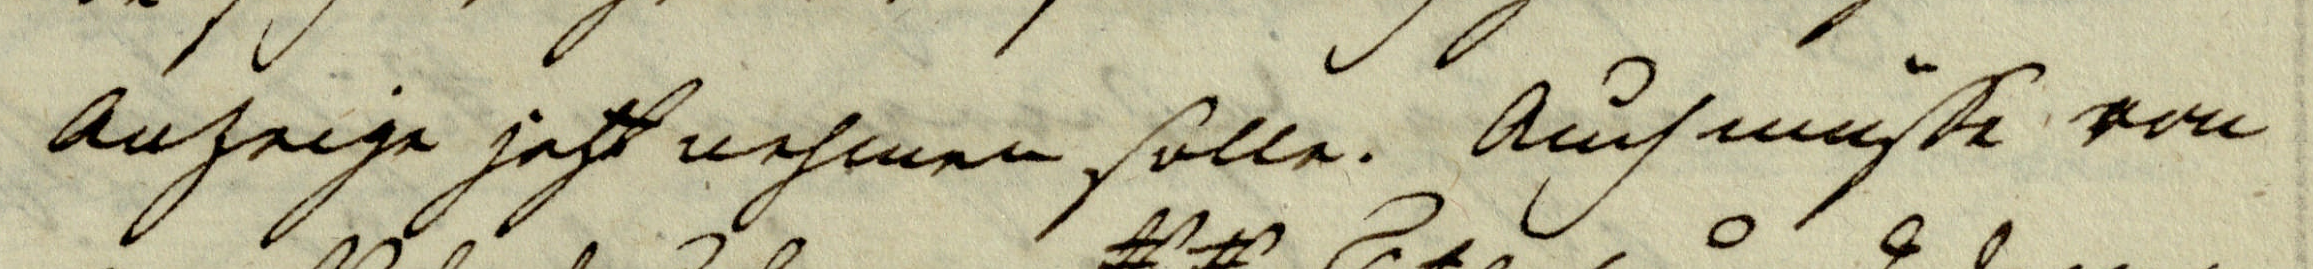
Anzeige jetzt nehmen solle. Auch müsse von
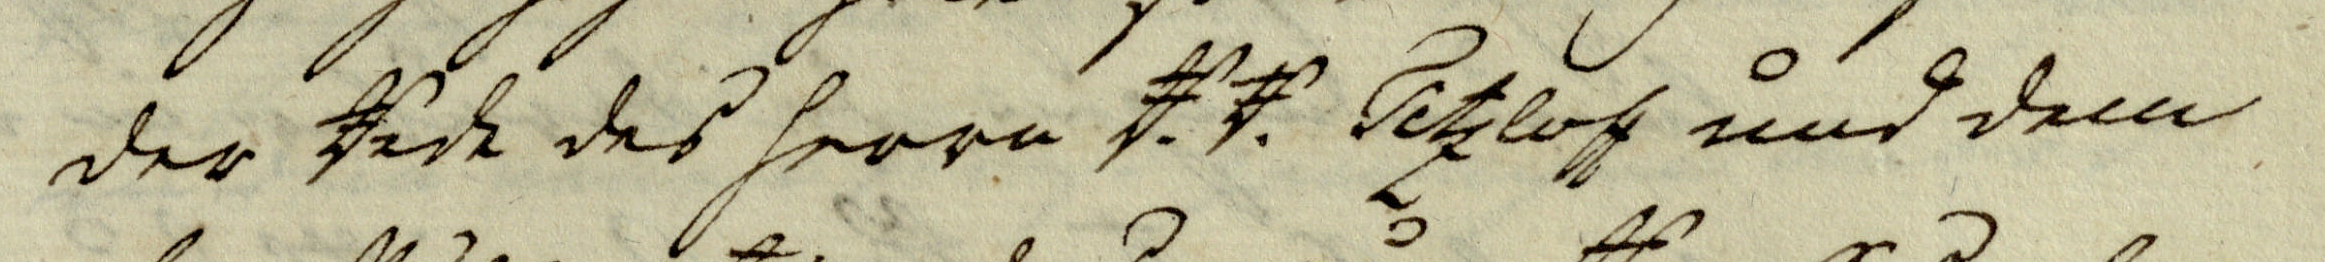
der Rede des Herrn R. R. Tetzloff und dem
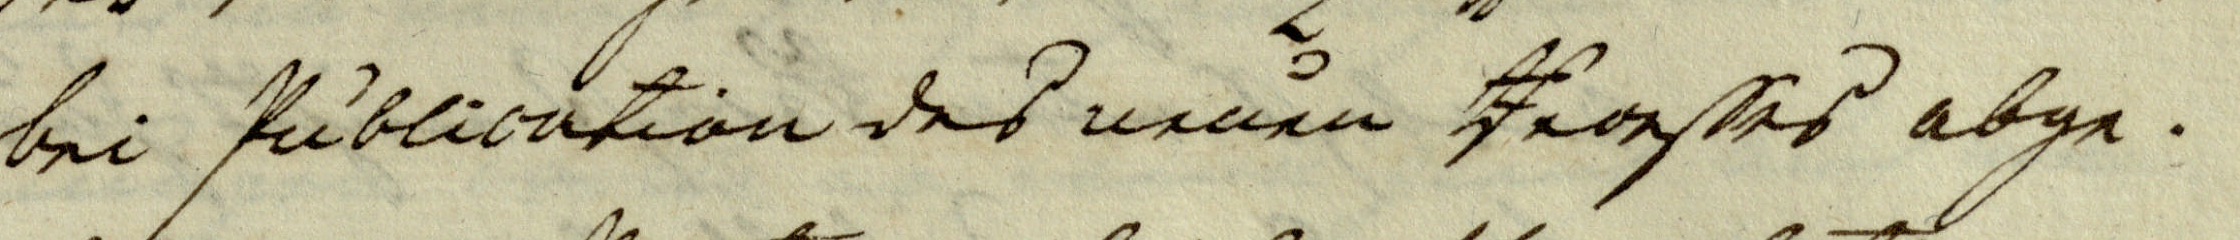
bei Publication des neuen Recesses abge¬
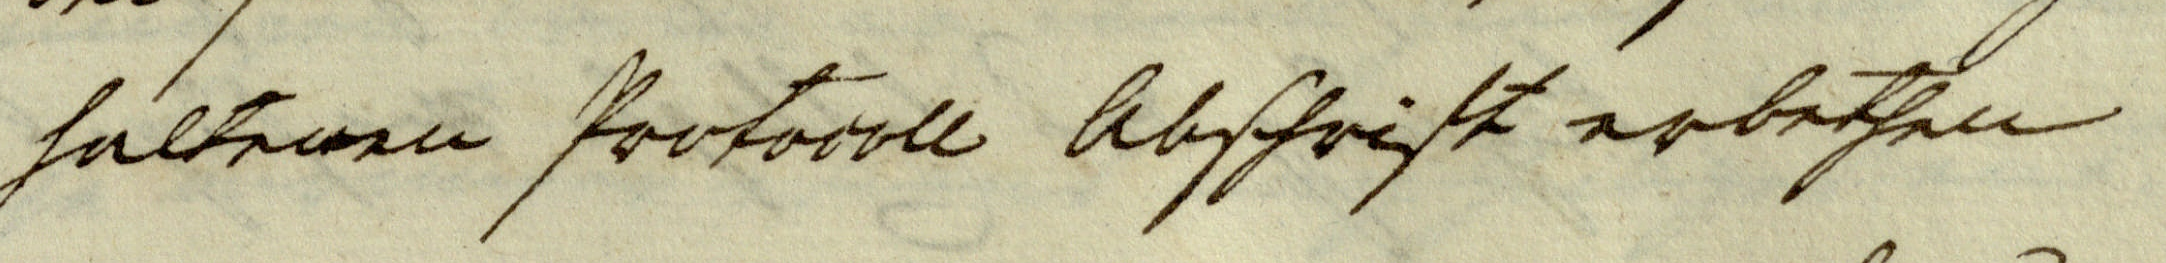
haltenen Protocoll Abschrift erbethen
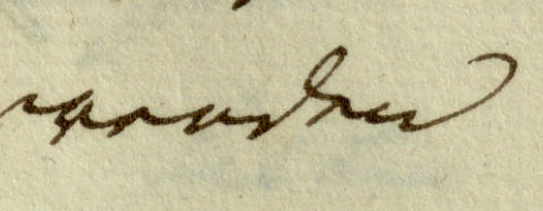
wenden
